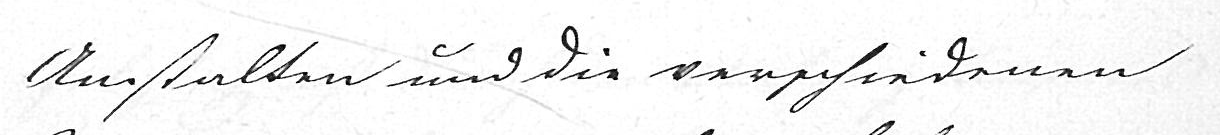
Anstalten und die verschiedenen
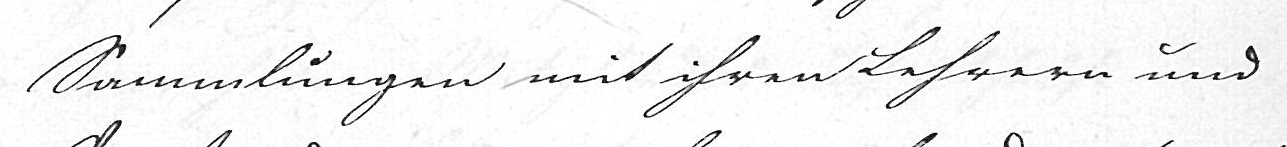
Sammlungen mit ihren Lehrern und
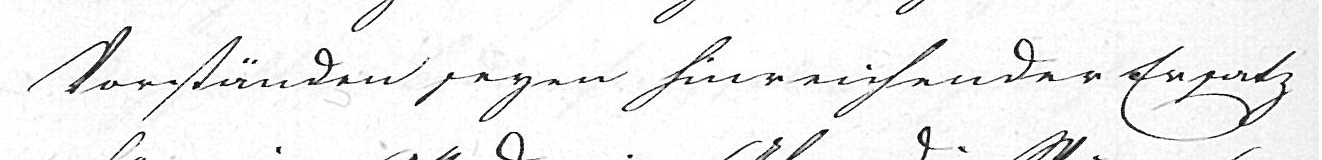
Vorständen seyen hinreichender Ersatz
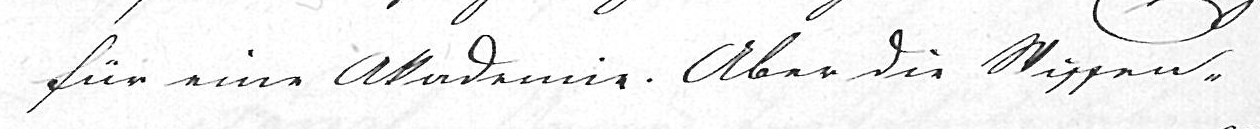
für eine Akademie. Aber die Wissen-
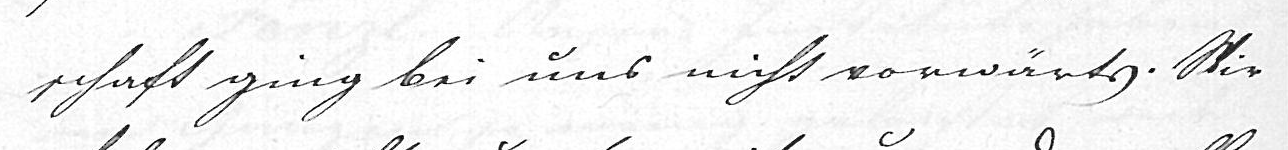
schaft ging bei uns nicht vorwärts. Wir
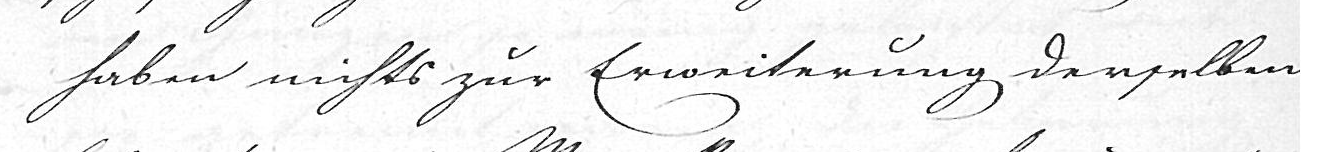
haben nichts zur Erweiterung derselben
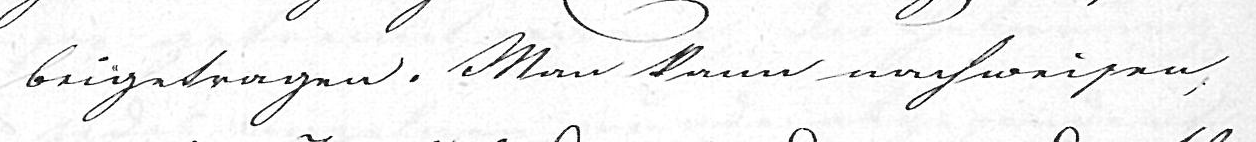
beigetragen. Man kann nachweisen,
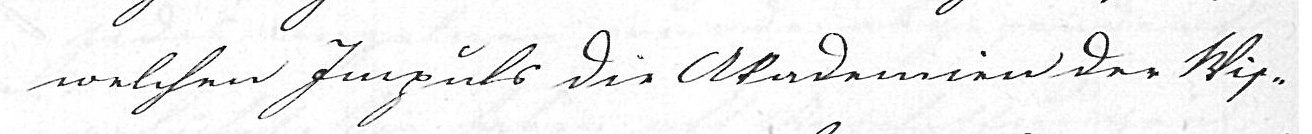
welchen Inpuls die Akademien der Wis-
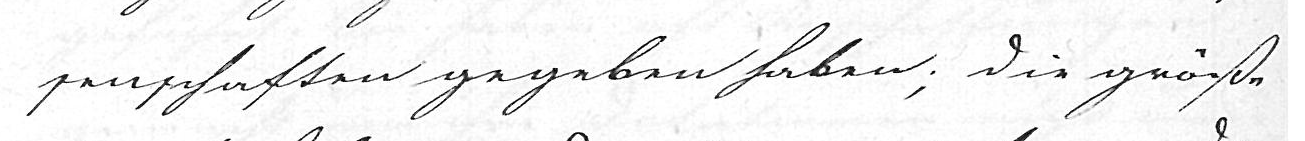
senschaften gegeben haben, die größ-
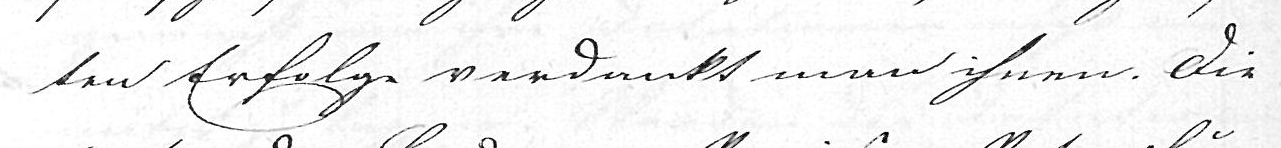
ten Erfolge verdankt man ihnen. Die
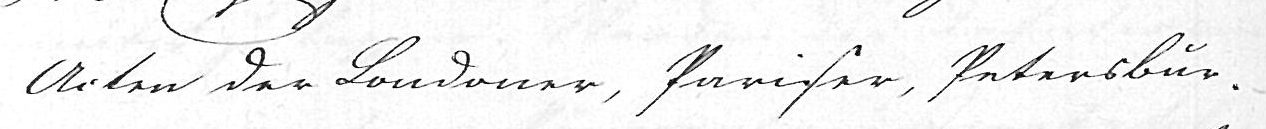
Acten der Londoner, Pariser, Peterbur-
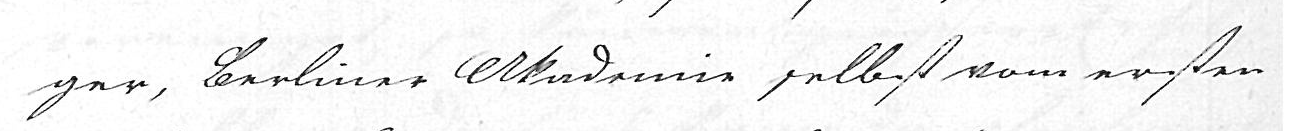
ger, Berliner Akademie selbst vom ersten
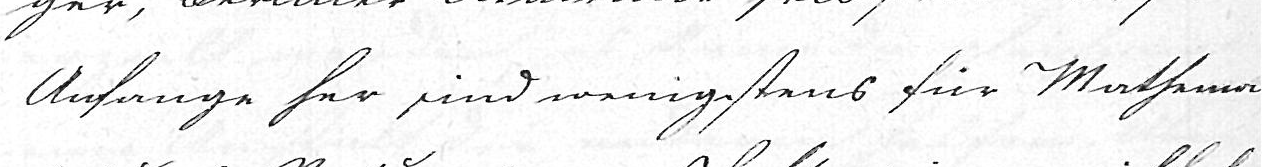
Anfange her sind wenigstens für Mathema-
